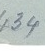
F. G.
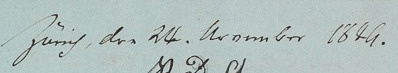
Zürich, den 24. November 1849.
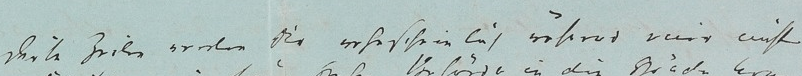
Diese Zeilen werden Dir wahrscheinlich während einer nicht
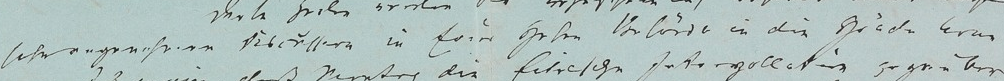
sehr angenehmen Discussion in Eurer Hohen Behörde in die Hände kom-
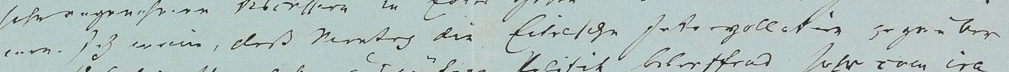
men. Ich meine, daß Montag die Eitelsche Interpellation gegenüber
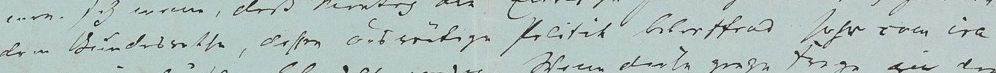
dem Bundesrathe, dessen auswärtige Politik betreffend sehr cum ira
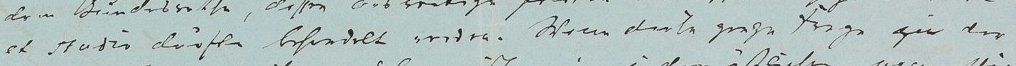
et studio dürfte behandelt werden. Wenn diese ganze Frage in der
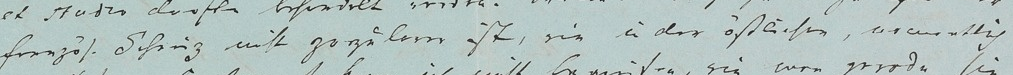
französ. Schweiz nicht populärer ist, wie in der östlichen, namentlich
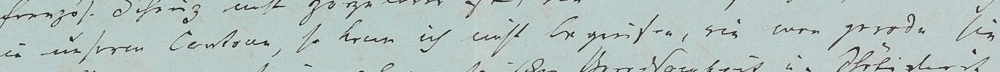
in unserm Cantone, so kann ich nicht begreifen, wie man gerade sie
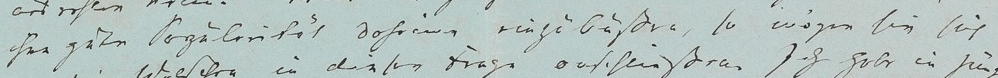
ihre gute Popularität daheime einzubüßen, so mögen sie sich
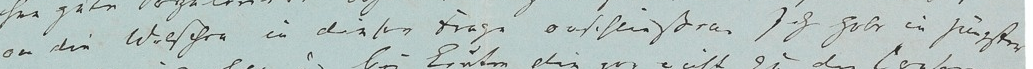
an die Welschen in dieser Frage anschließen. Ich habe in jüngster
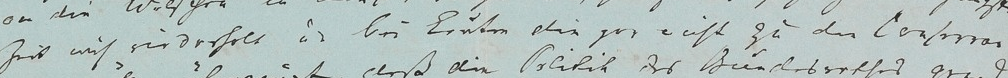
Zeit mich wiederholt u. bei Leuten die gar nicht zu den Conserva-
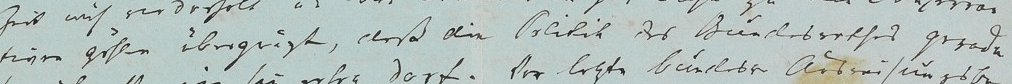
tiven zählen überzeugt, daß die Politik des Bundesrathes gerade
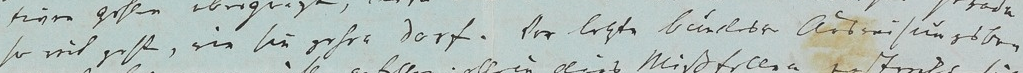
so weit geht, wie sie gehen darf. Der letztebundesr. Ausweisungsbe-
